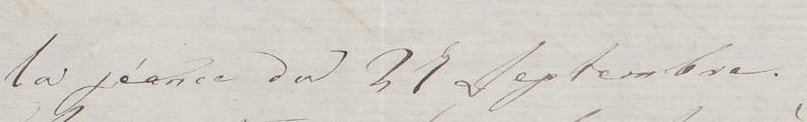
la séance du 27 Septembre.
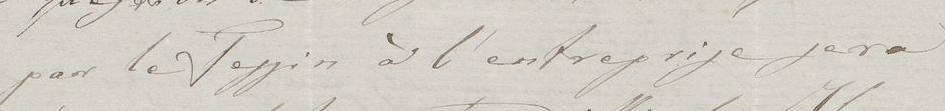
par le Tessin à l'entreprise sera
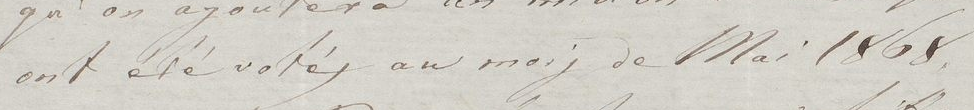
ont été votés au mois de Mai 1868,
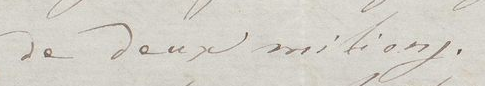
de deux milions.
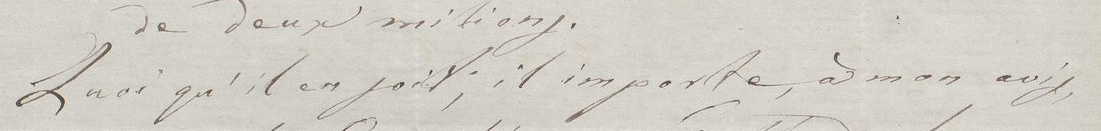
Quoi qu'il en soit; il importe, à mon avis,
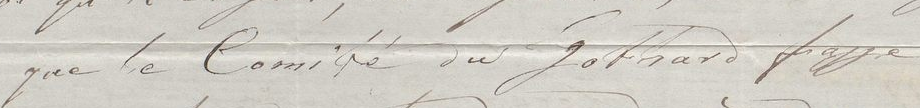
que le Comité du Gothard fasse
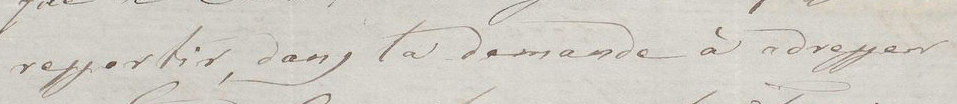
ressortir, dans la demande à adresser
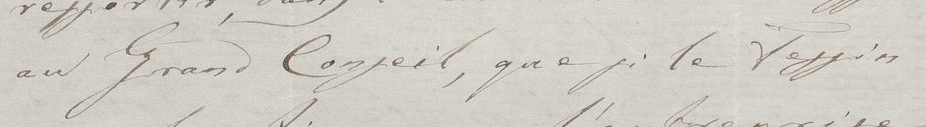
au Grand Conseil, que si le Tessin
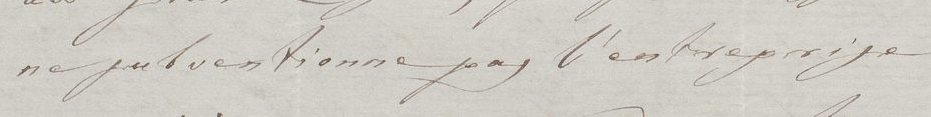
ne subventionne pas l'entreprise
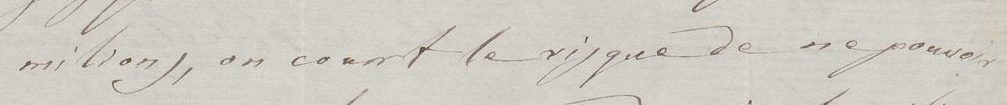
milions, on court le risque de ne pouvoir
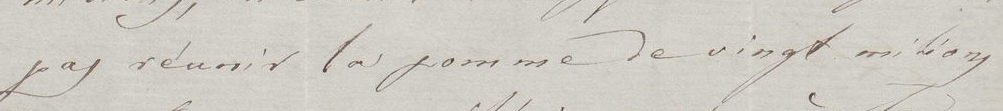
pas réunir la somme de vingt milions
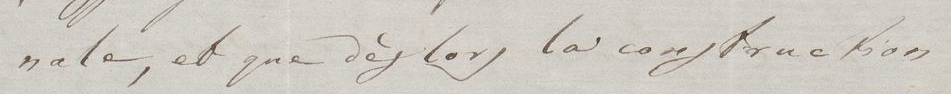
nale, et que dès lors la construction
